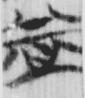益
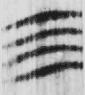四
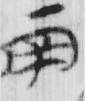兩
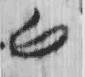㠯（以）
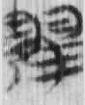翟（糴）
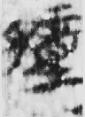穜（種）
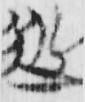迄
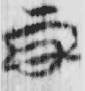○（期）
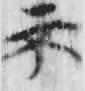不
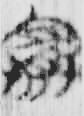賽
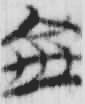金
